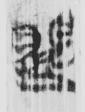{興止}
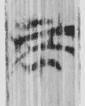不
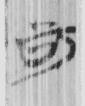可
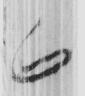㠯（以）
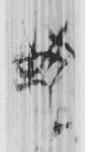幸
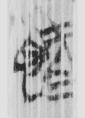既
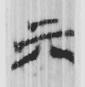亓
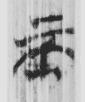不
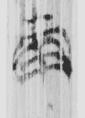兩
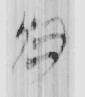於
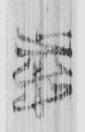𢝬
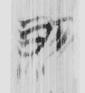則
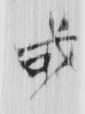或
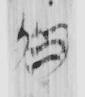於
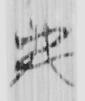弗
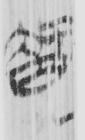智
